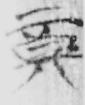奠
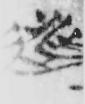逃
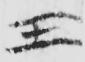壬
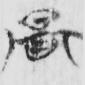晨
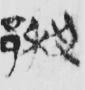○（梁）
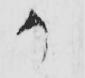人
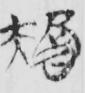○（胡）
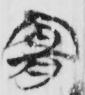宜
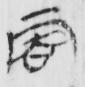丙
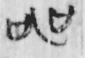申
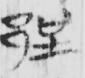郢
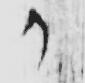人
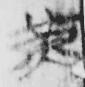黃
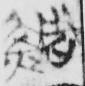鯛
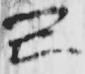己
